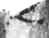巳
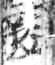○（陷）
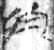於
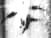午
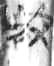○（破）
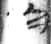於
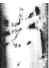未
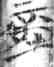坪（平）
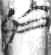於
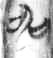申
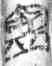寍（寧）
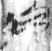於
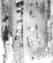梄（酉）
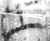工（空）
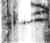於
